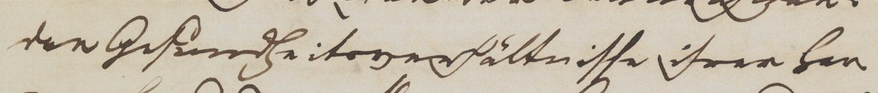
den Gesundheitsverhältnisse ihrer Her-
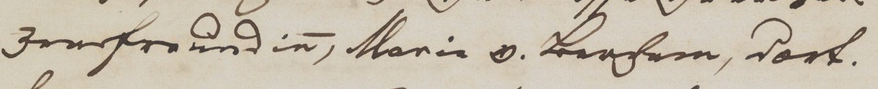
zensfreundinn, Marie v. Berchem, dort-
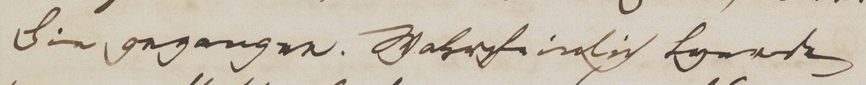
hin gegangen. Wahrscheinlich werde
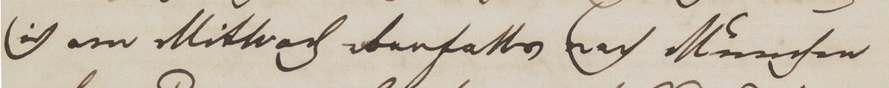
ich am Mittwoch ebenfalls nach München
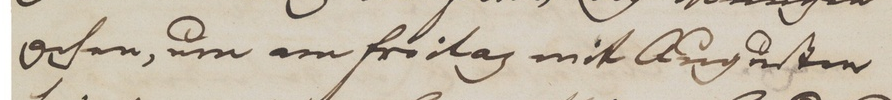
gehen, um am Freitag mit Augusten
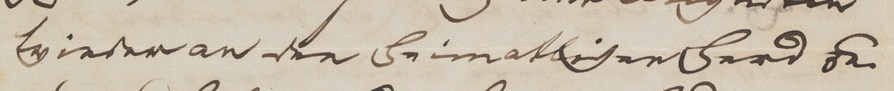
wieder an den heimatlichen Herd zu-
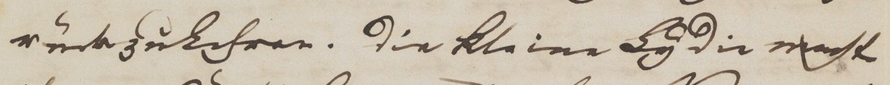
rückzukehren. Die kleine Lydie macht
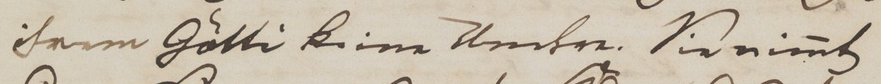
ihrem Götti keine Unehre. Sie nimmt
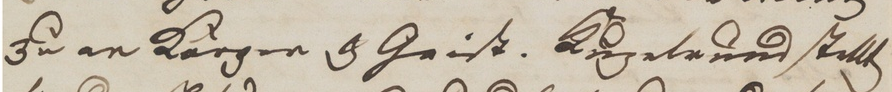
zu an Körper & Geist. Kugelrund stellt
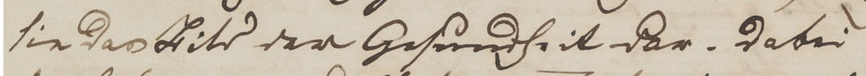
sie das Bild der Gesundheit dar. Dabei
